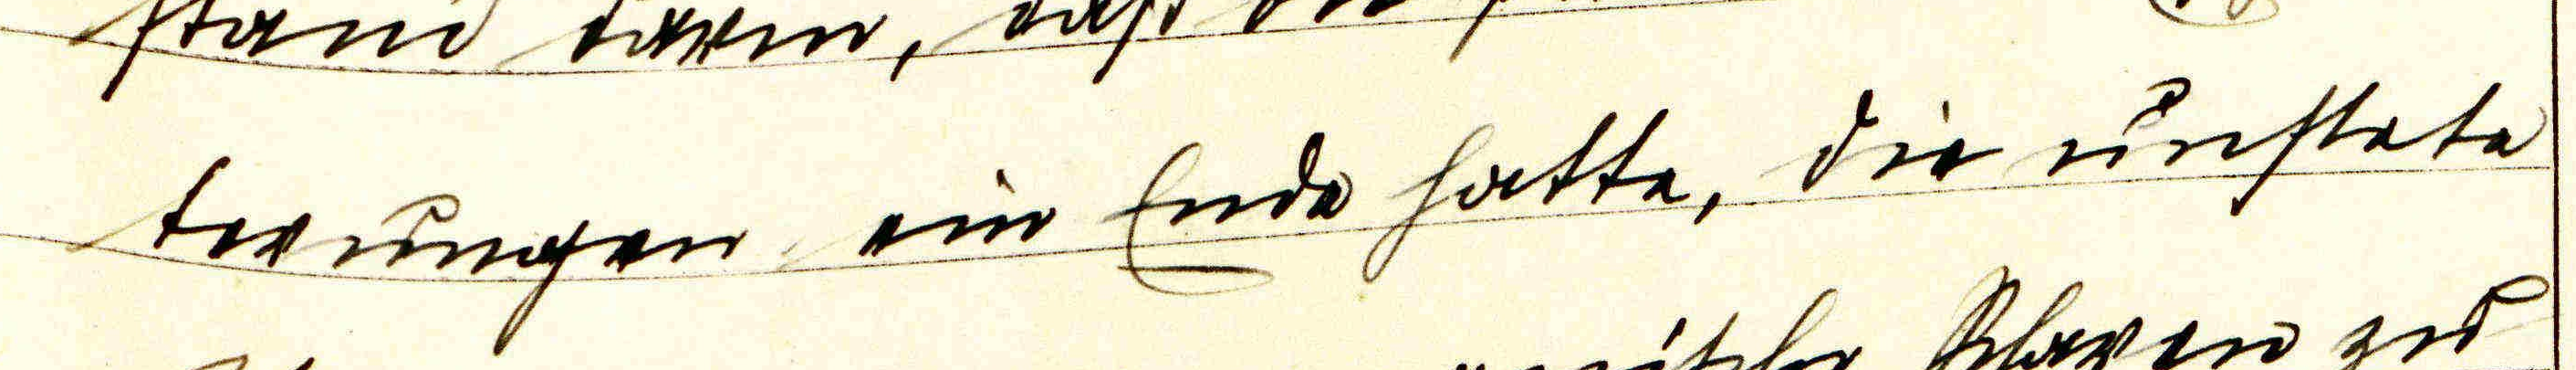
terungen ein Ende hatte, die unstete
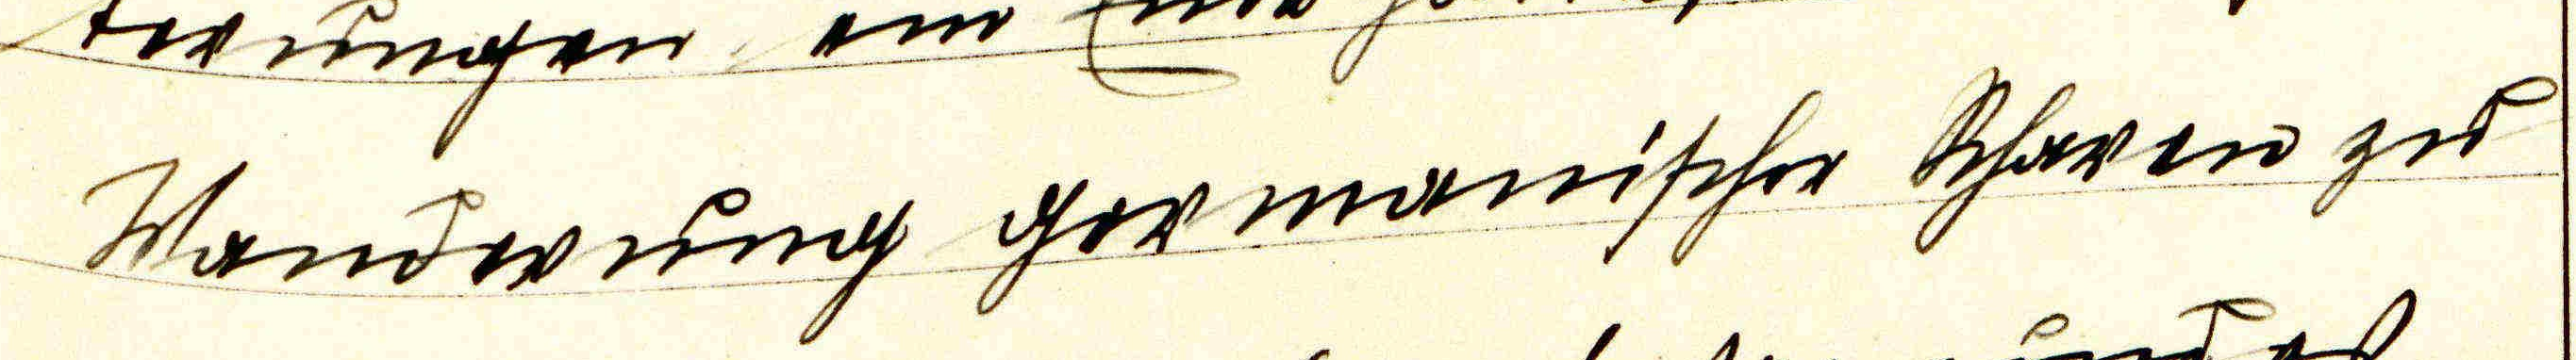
Wanderung germanischer Scharen
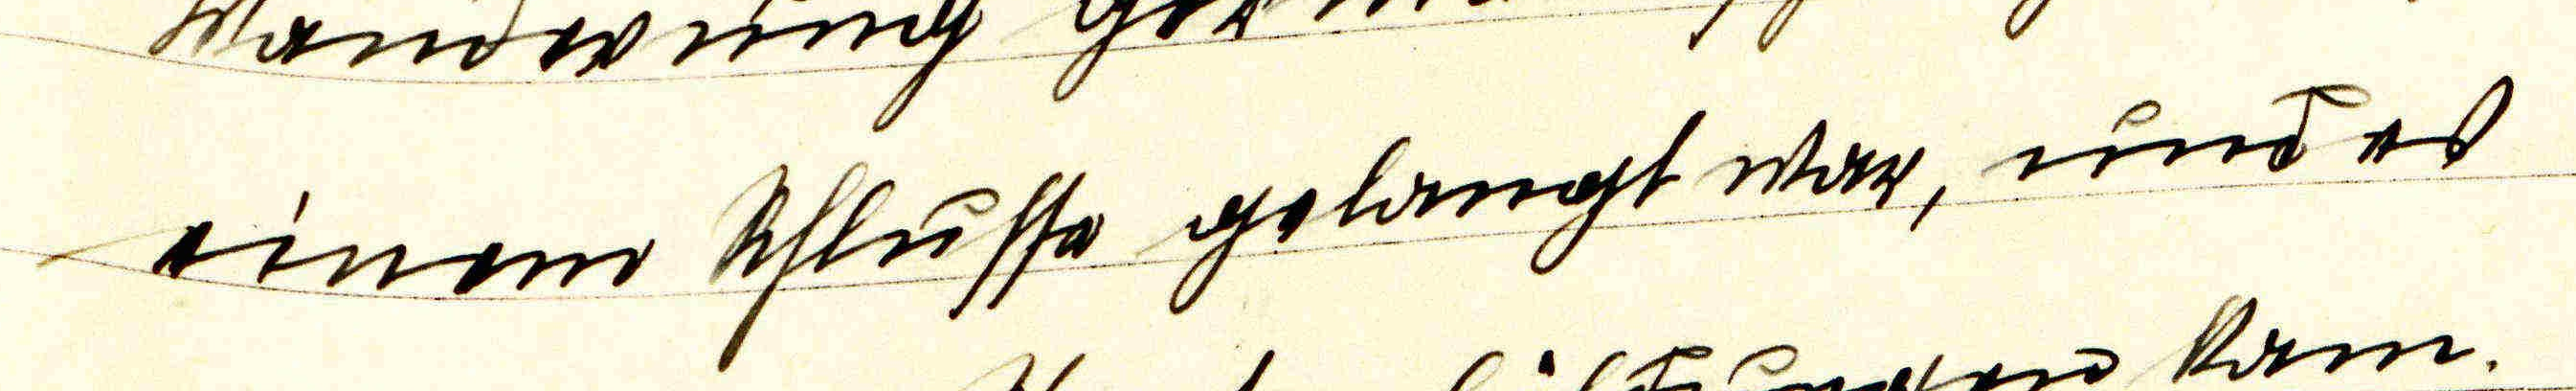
zu einem Schlusse gelangt war, und es
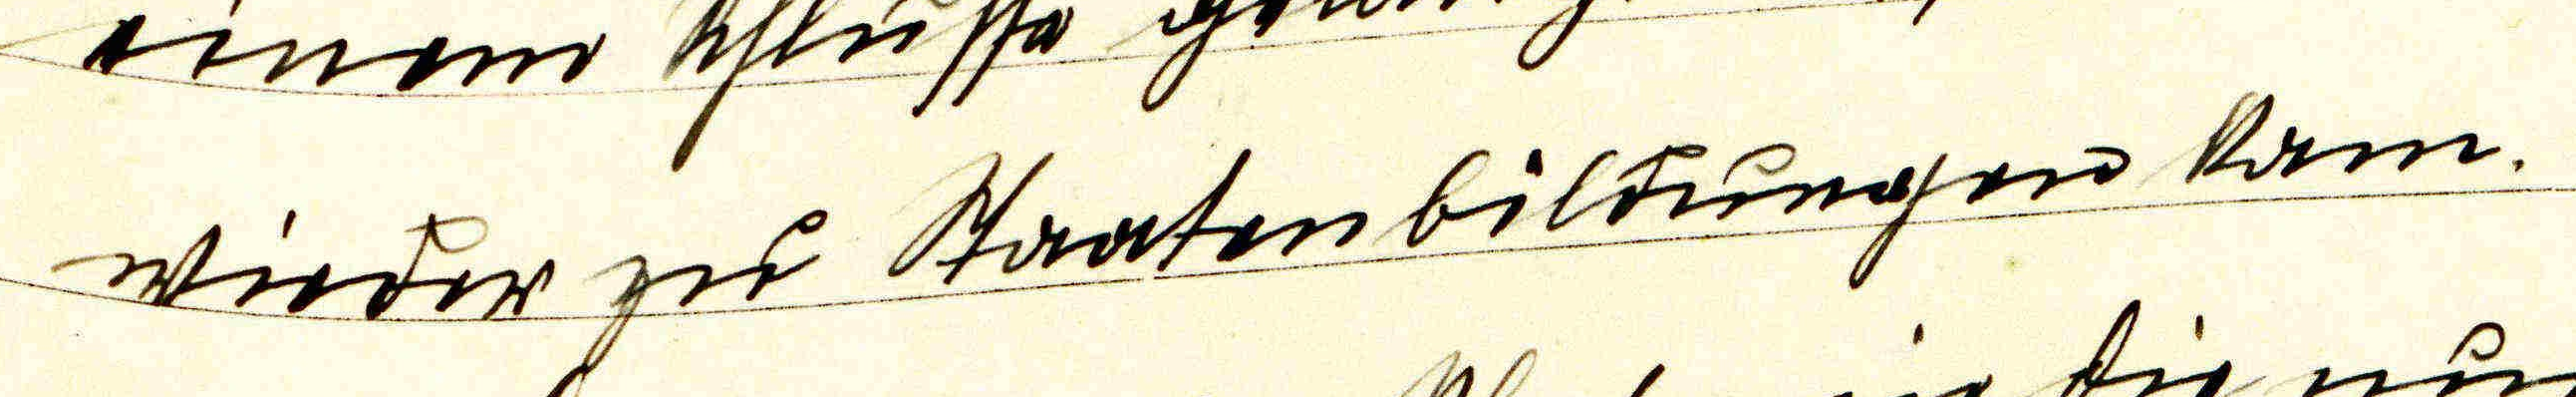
wieder zu Staatenbildungen kam.
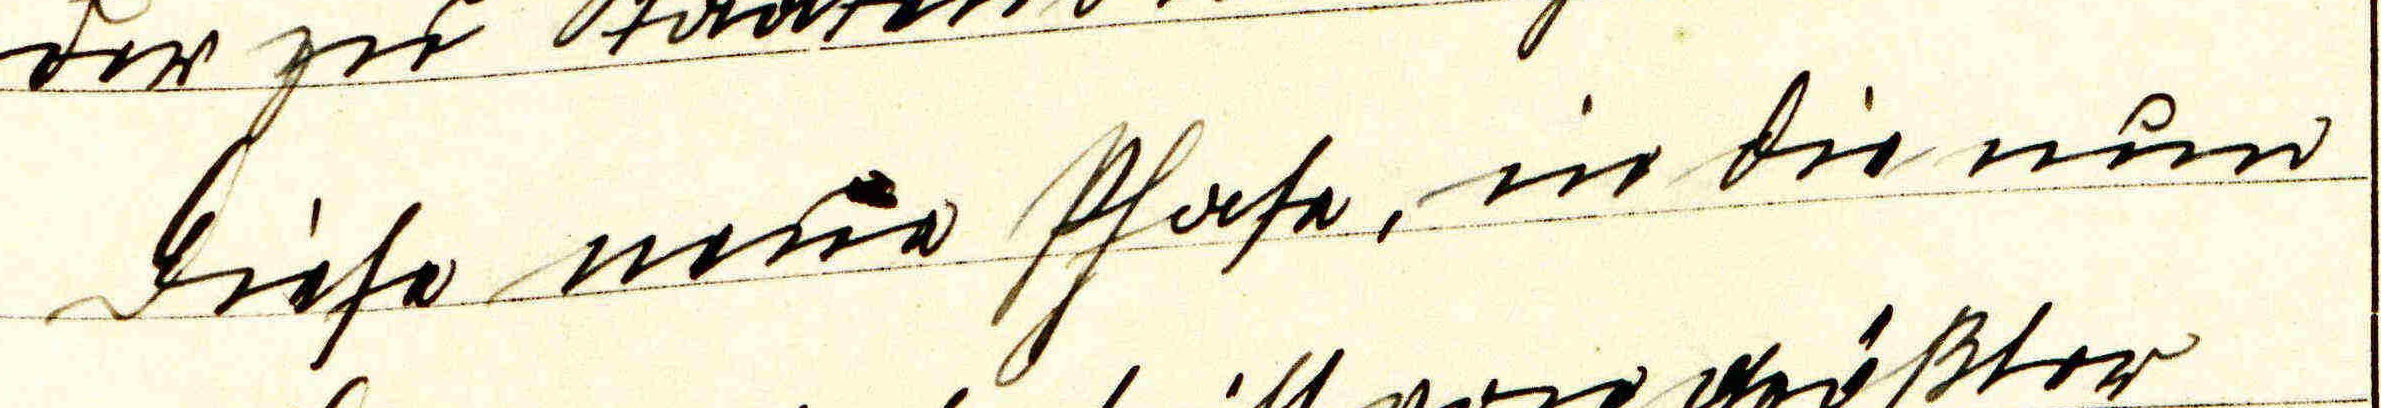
Diese neue Phase, in die nun
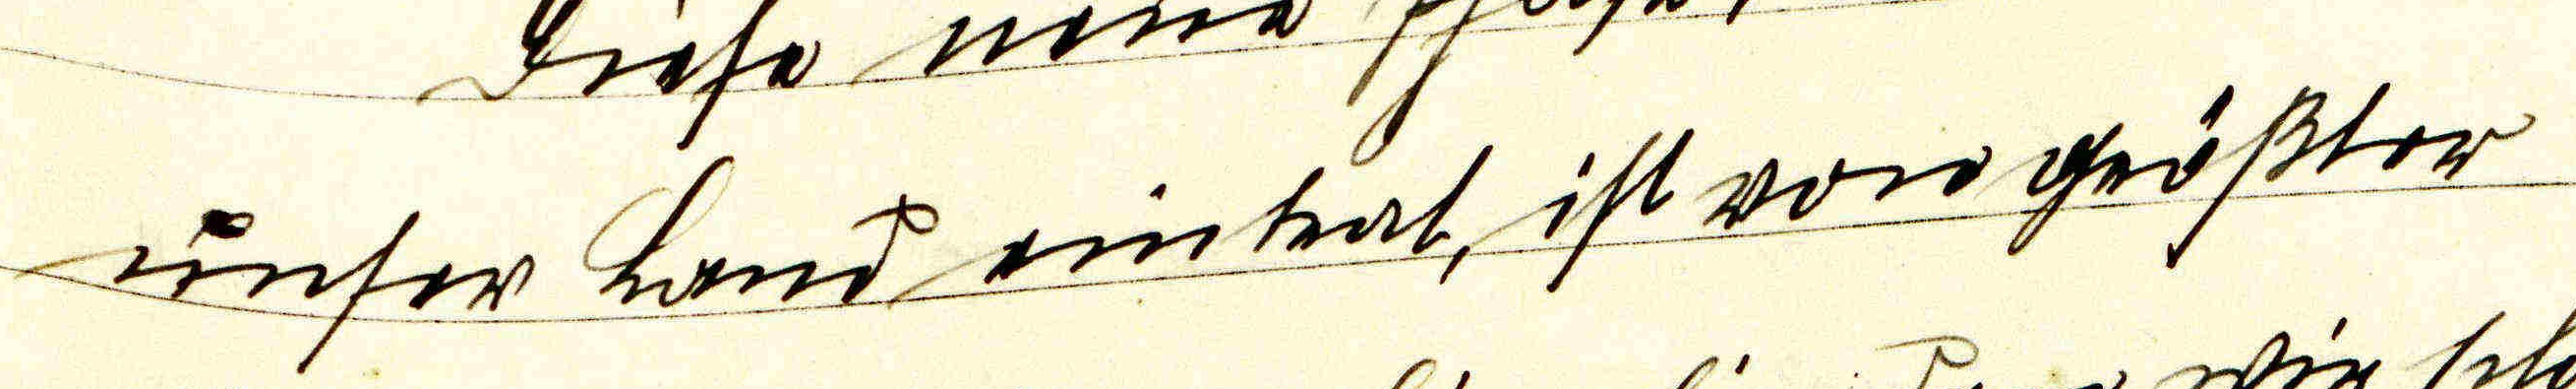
unser Land eintrat ist von größter
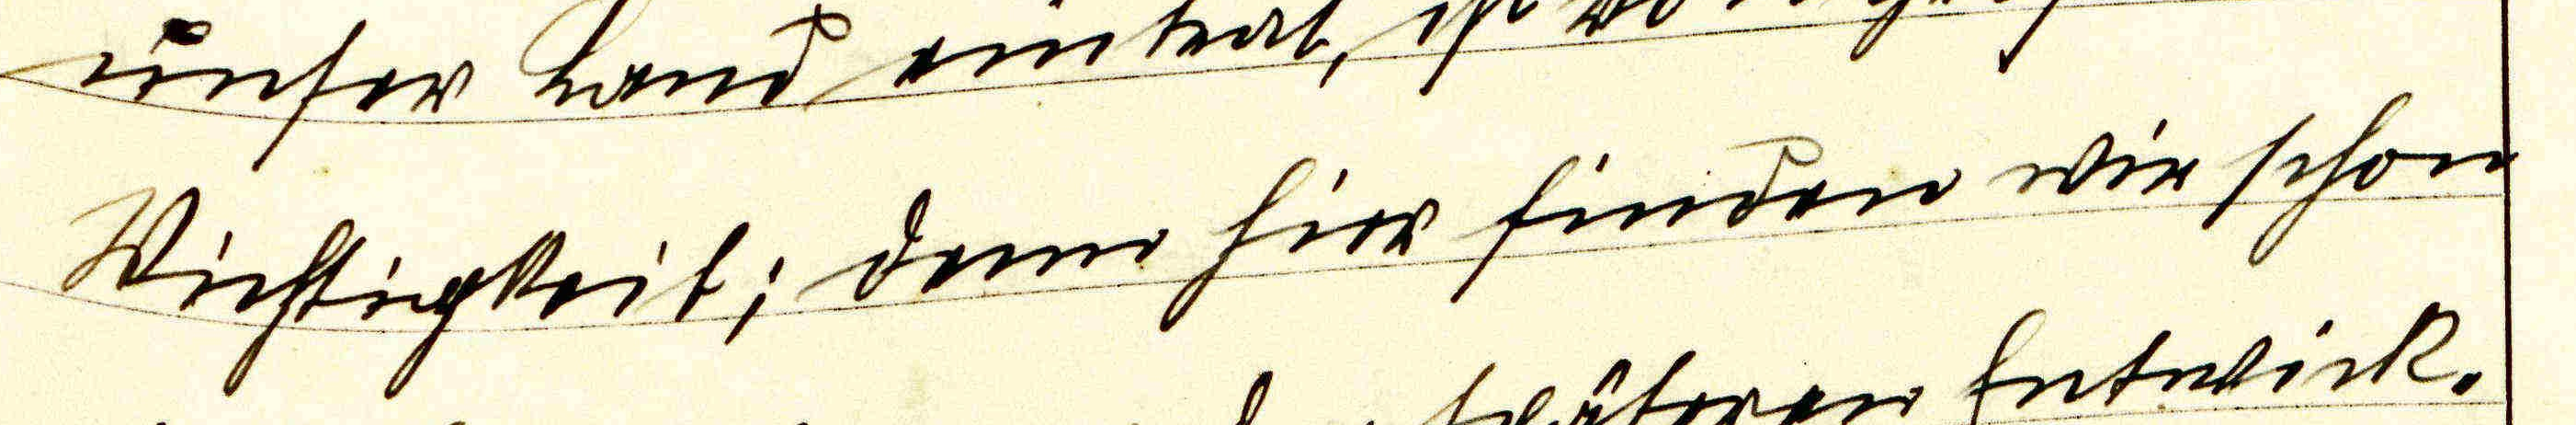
Wichtigkeit; denn hier finden wir schon
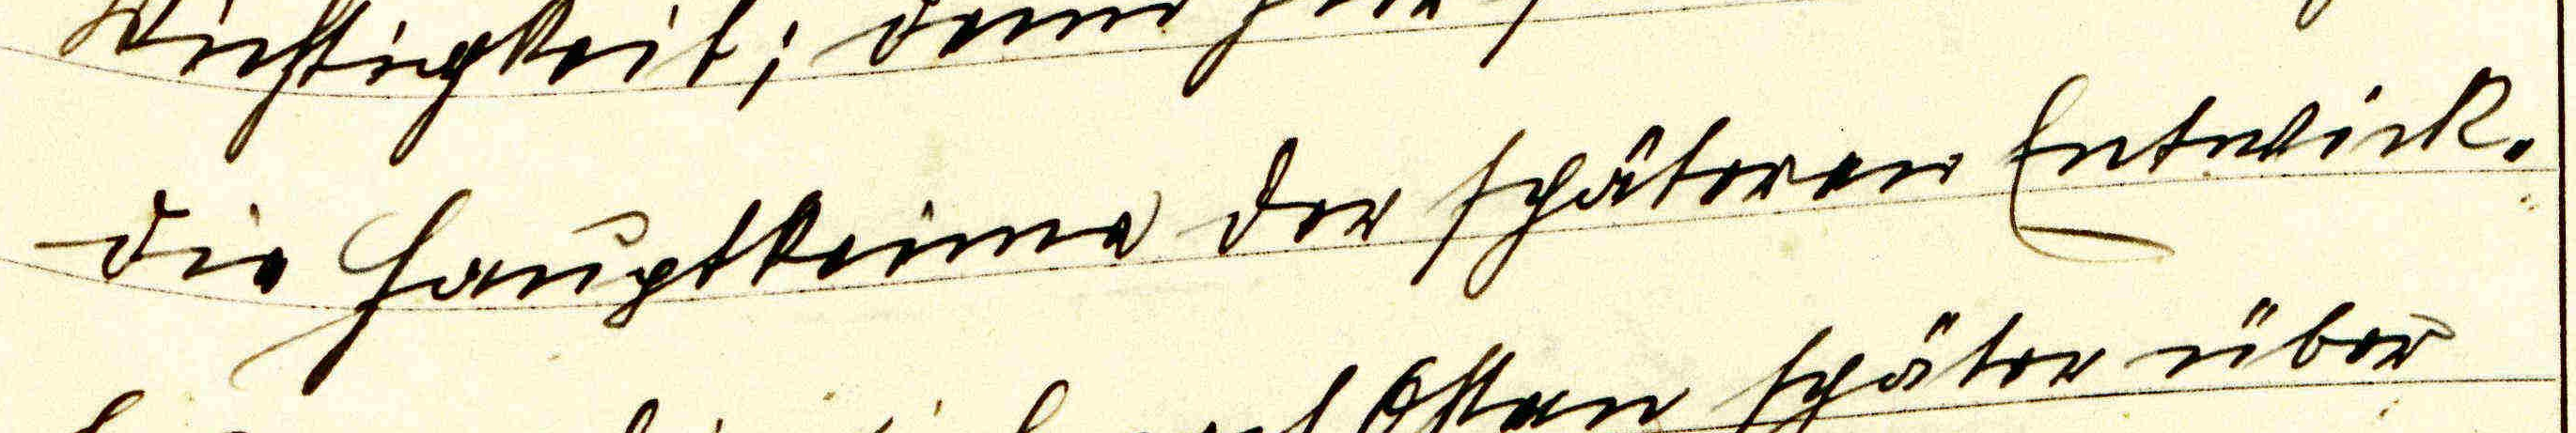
die Hauptkeime der späteren Entwick-
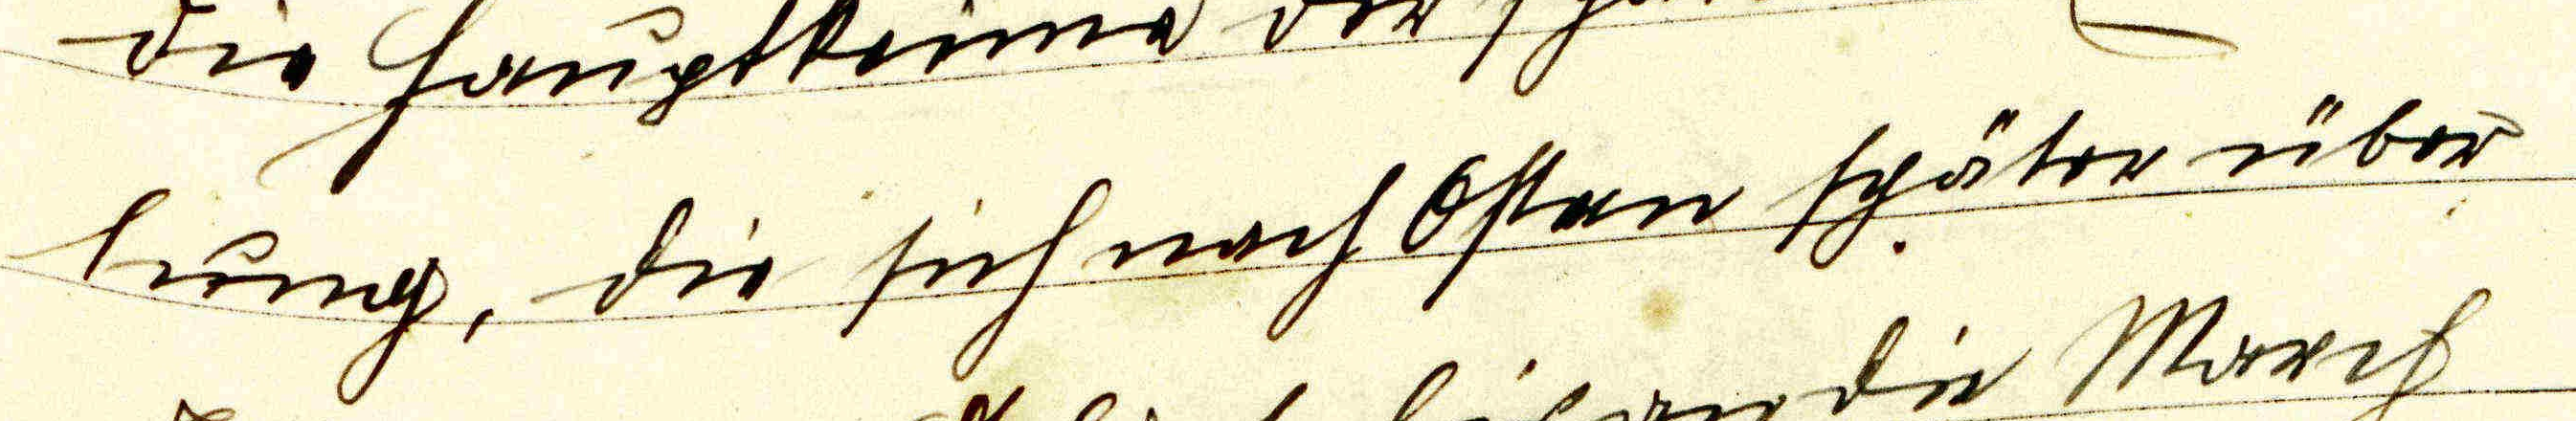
lung, die sich nach Osten später über
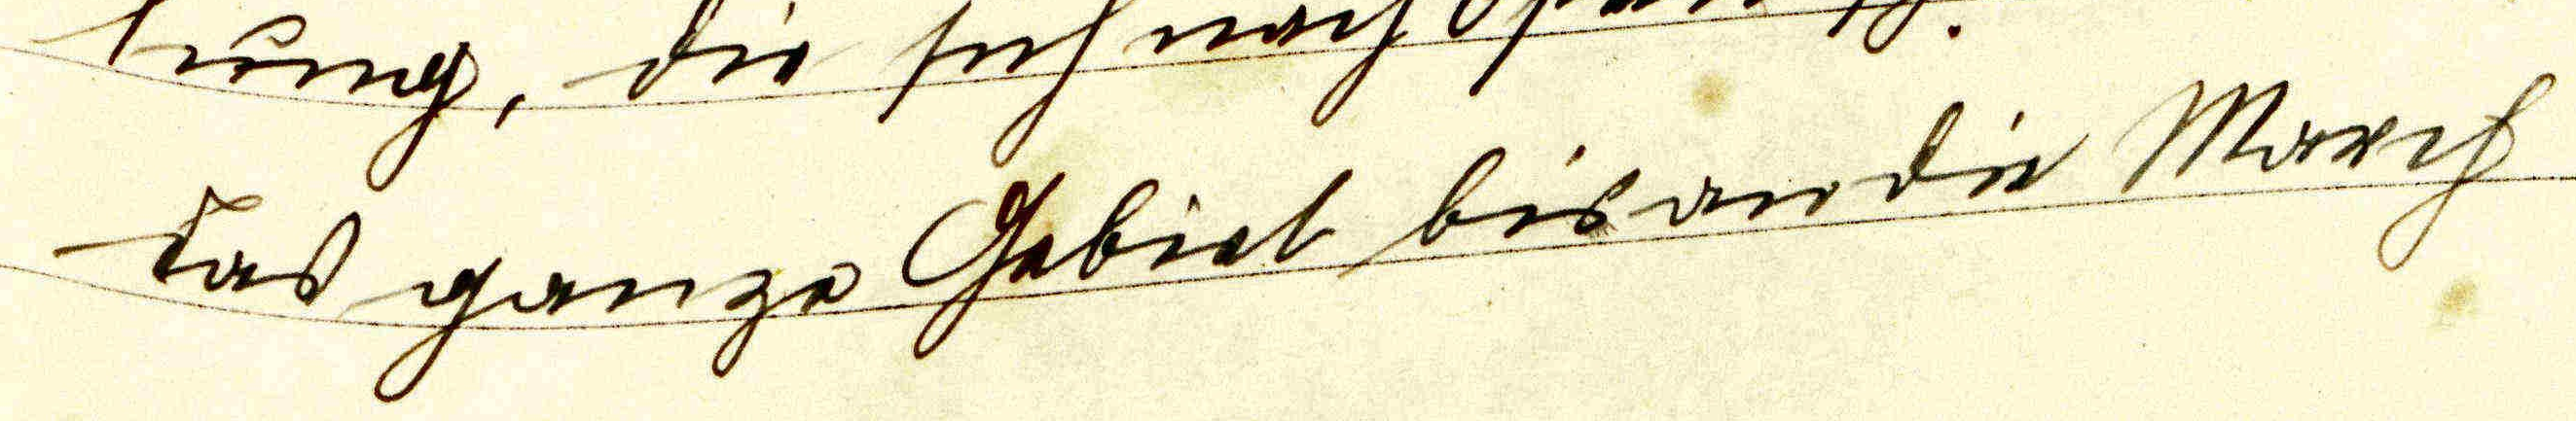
das ganze Gebiet bis an die March
